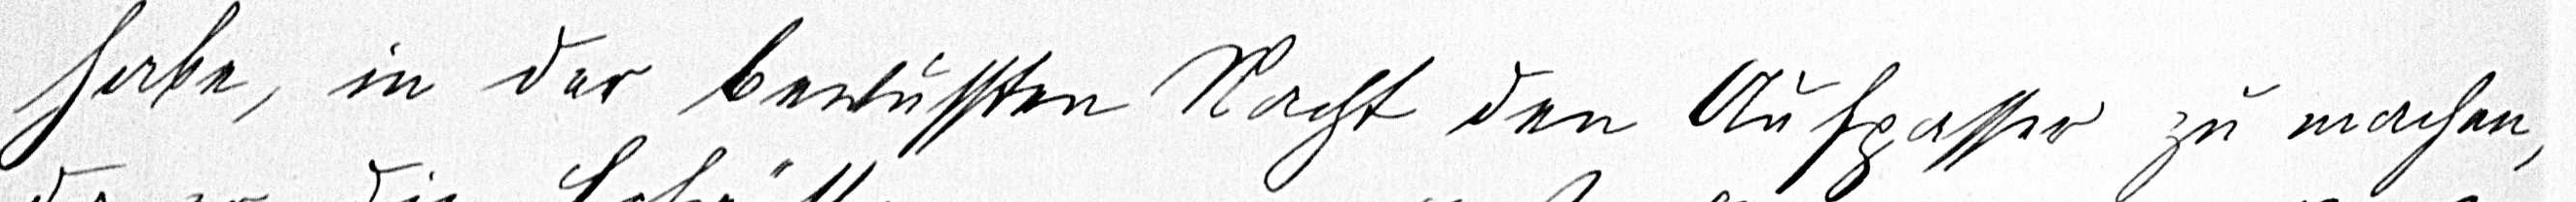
habe, in der bewußten Nacht den Aufpasser zu machen,
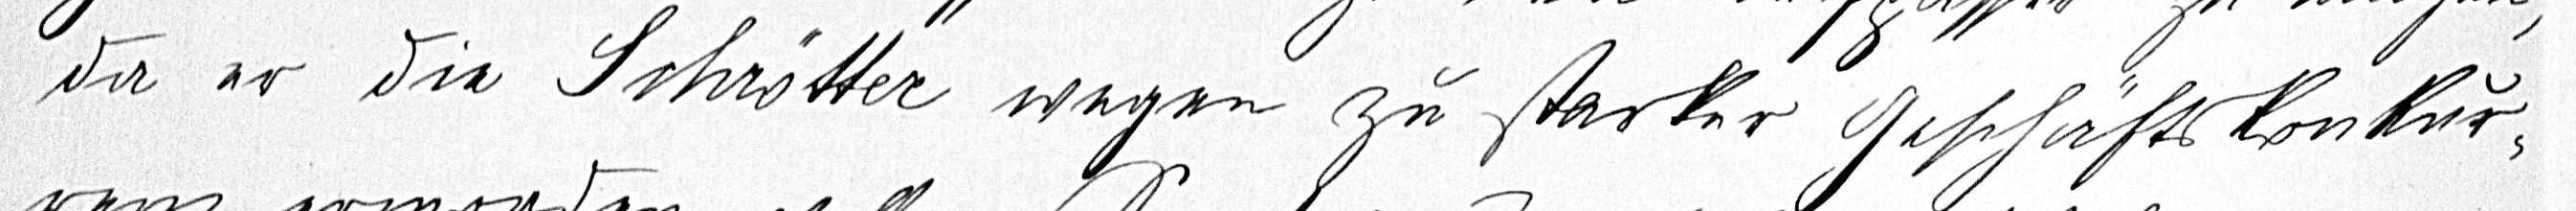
da er die Schrötter wegen zu starker Geschäftskonkur¬
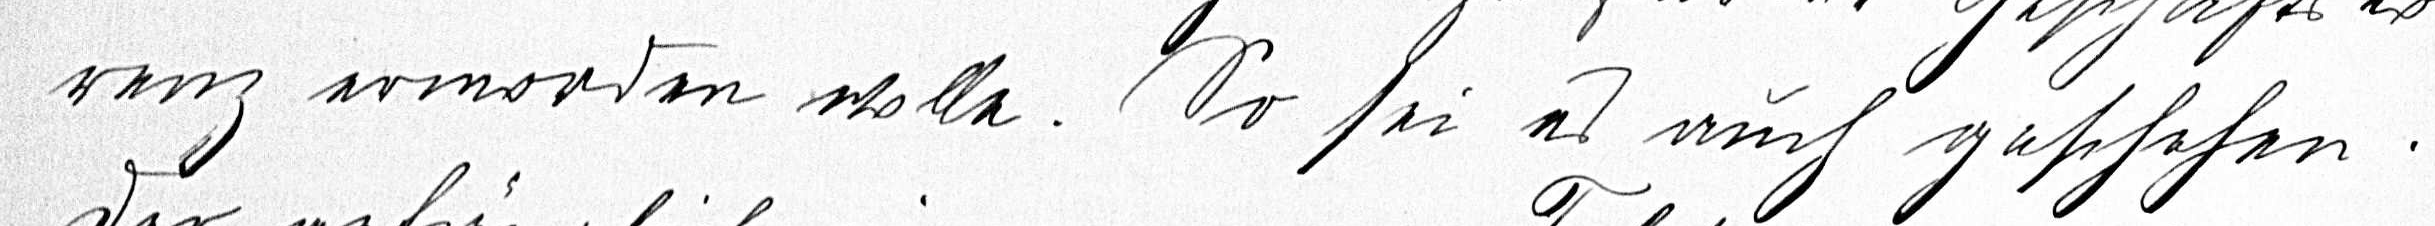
renz ermorden wolle. So sei es auch geschehen.
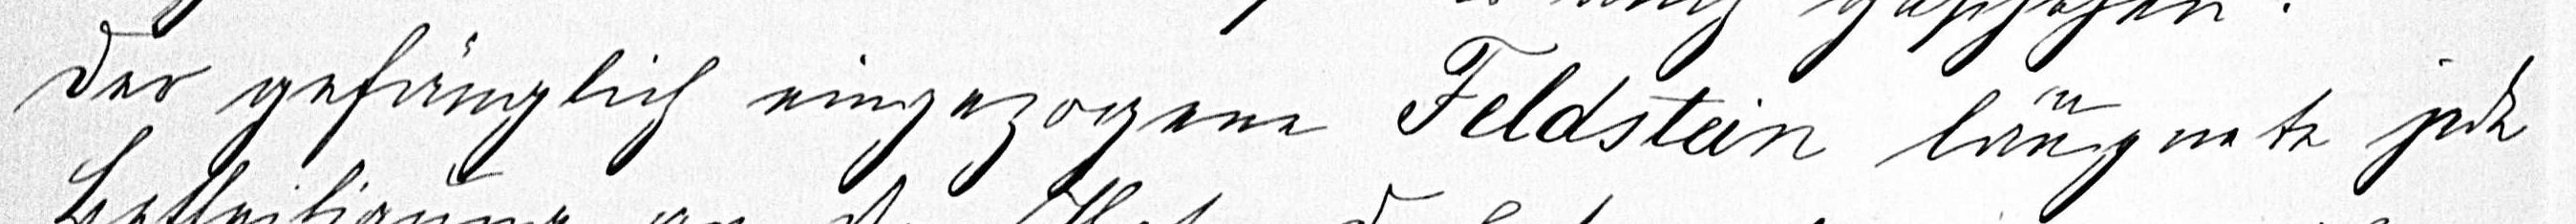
Der gefänglich eingezogene Feldstein längnete jede
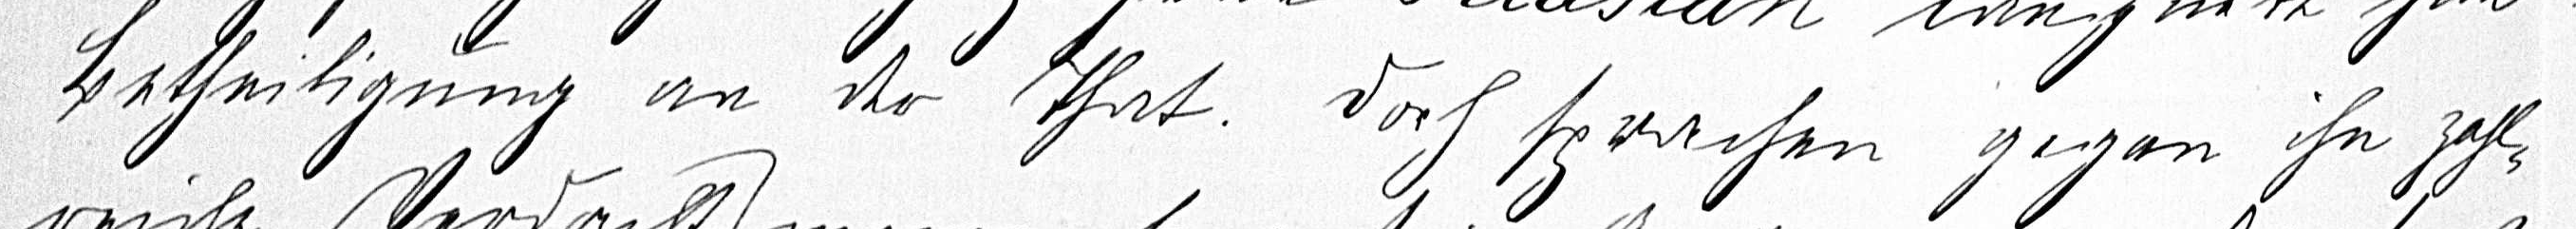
Betheiligung an der That. Doch sprachen gegen ihn zahl¬
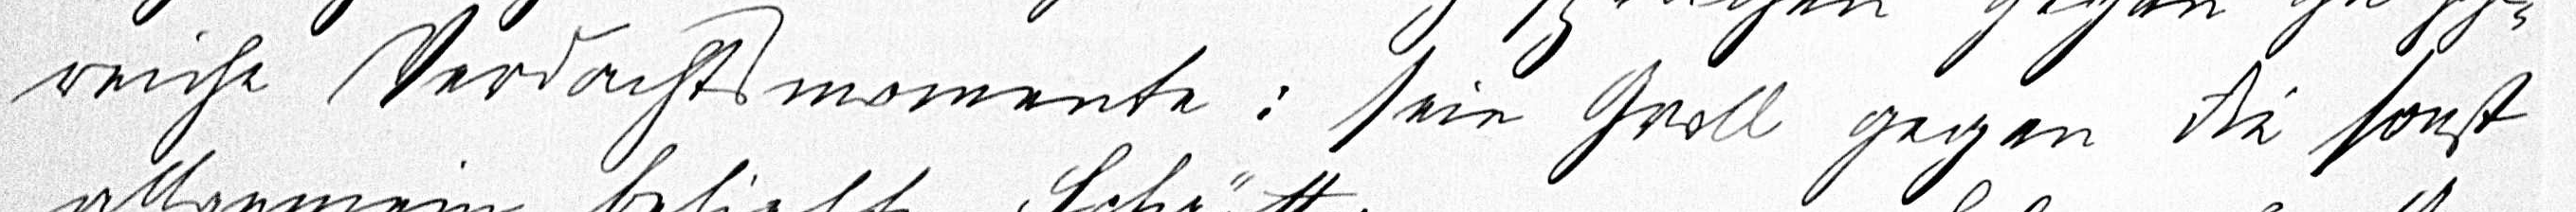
reiche Verdachtsmomente: sein Groll gegen die sonst
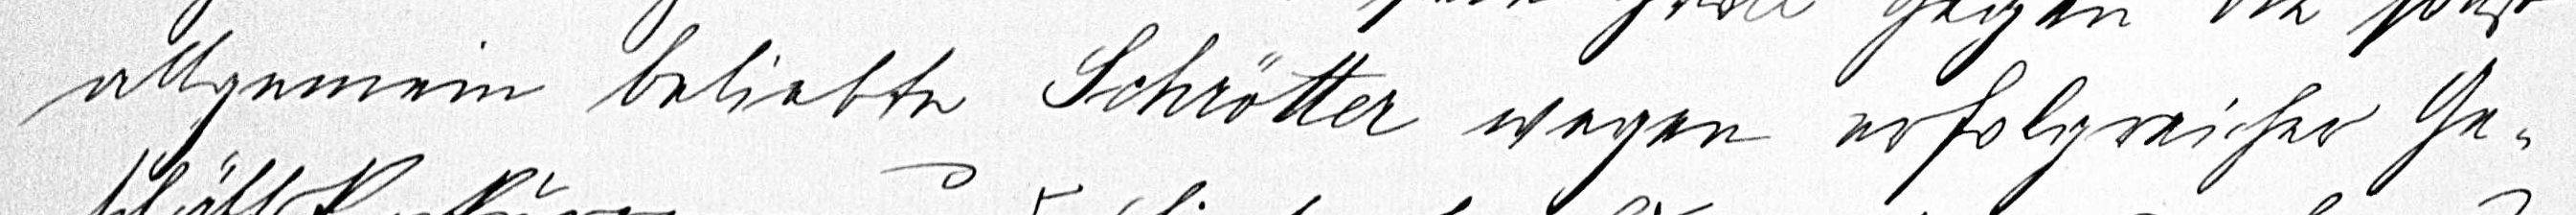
allgemein beliebte Schrötter wegen erfolgreicher Ge¬
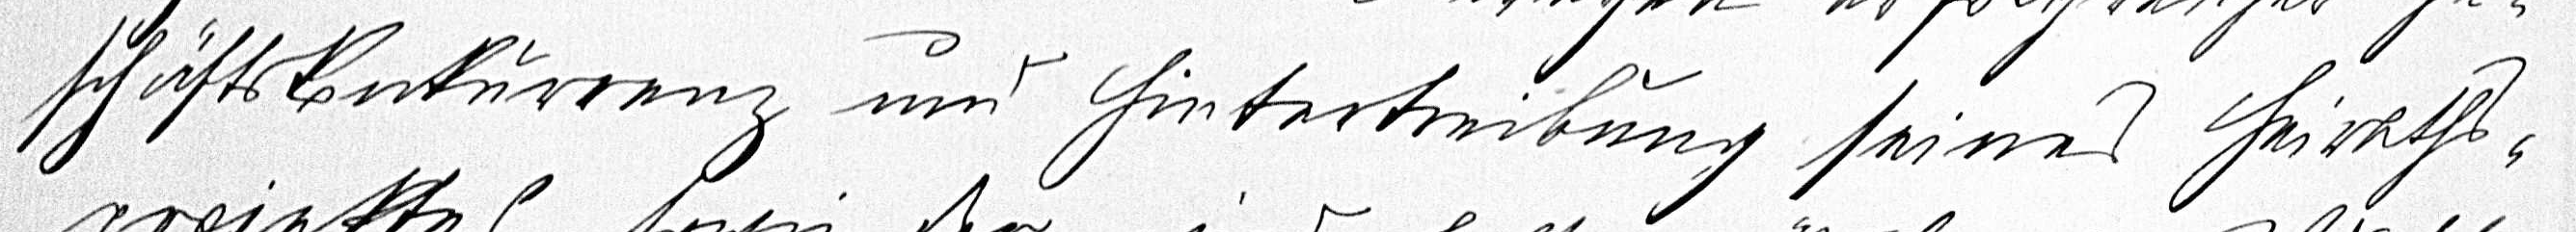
schäftskonkurrenz und Hintertreibung seines Heiraths¬
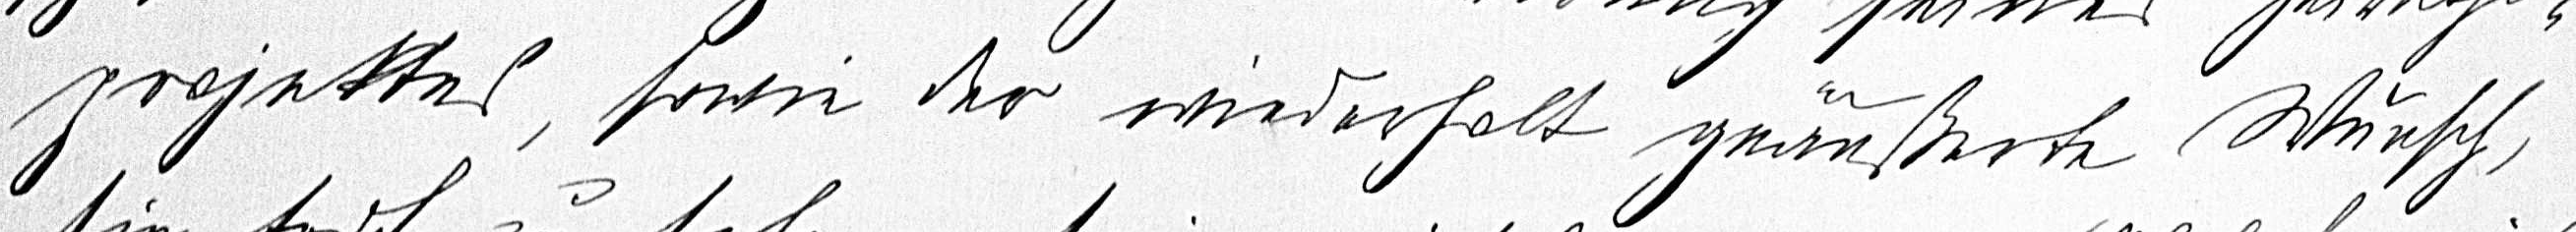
projektes, sowie der wiederholt geäußerte Wunsch,
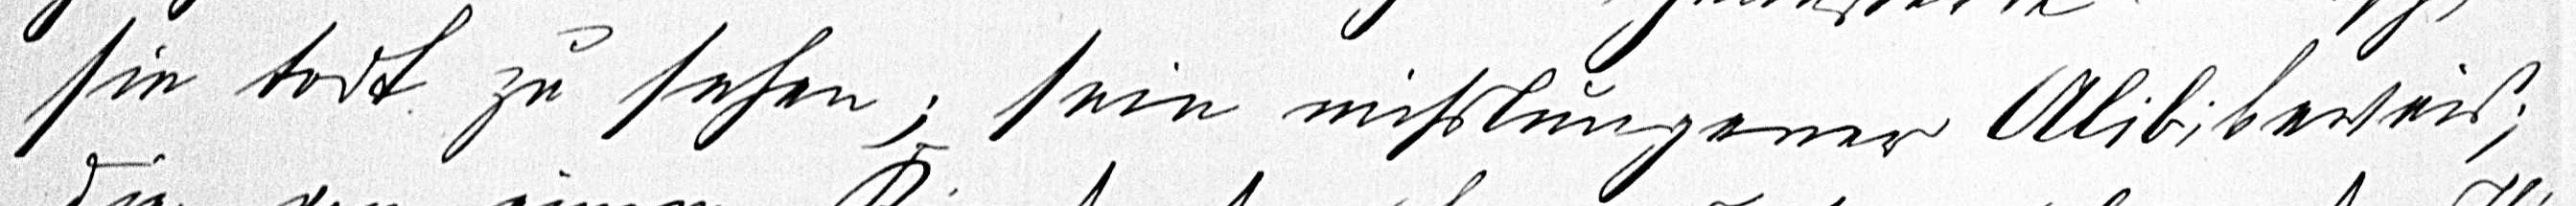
sie todt zu sehen; sein mißlungener Alibibeweis;
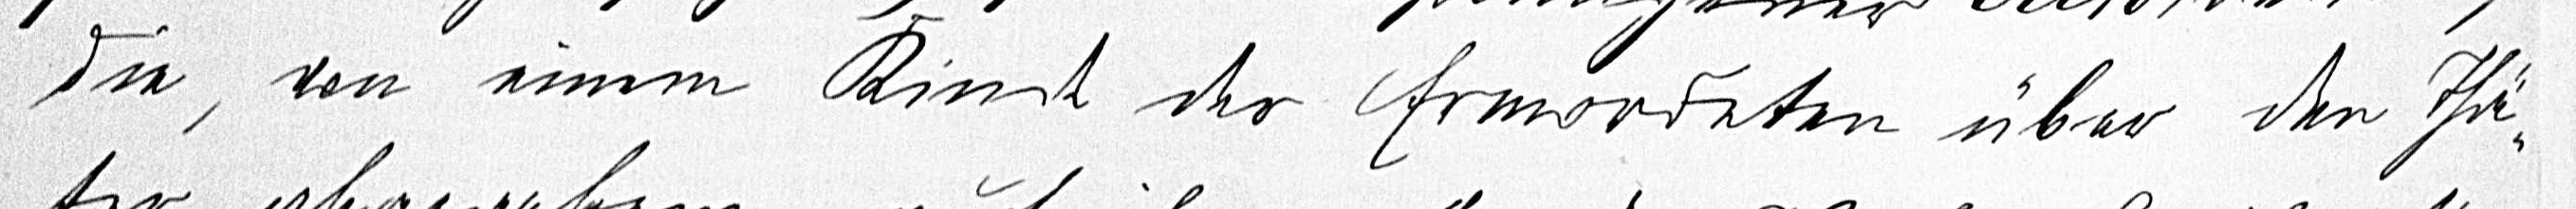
die von einem Kinde der Ermordeten über den Thä¬
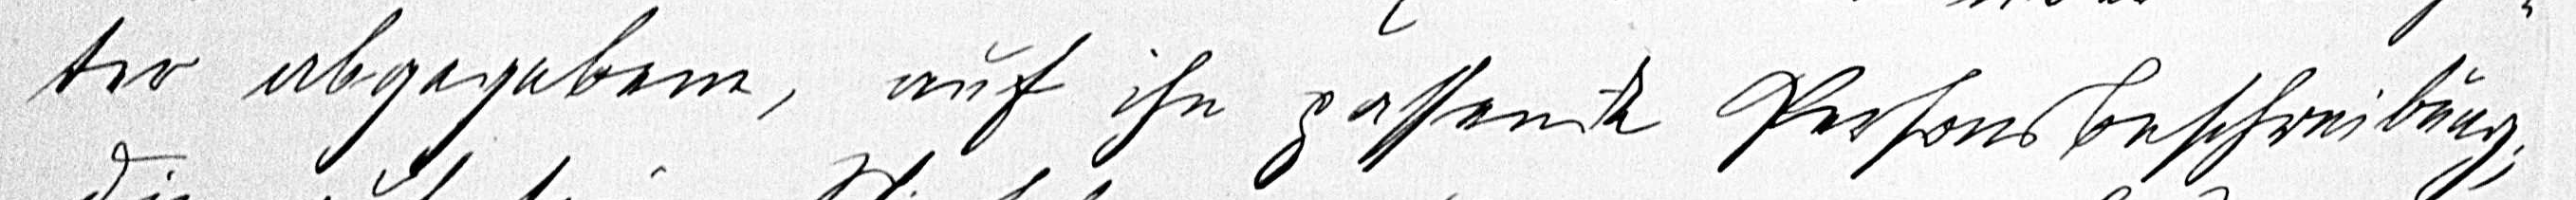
ter abgegebene, auf ihn passende Personsbeschreibung;
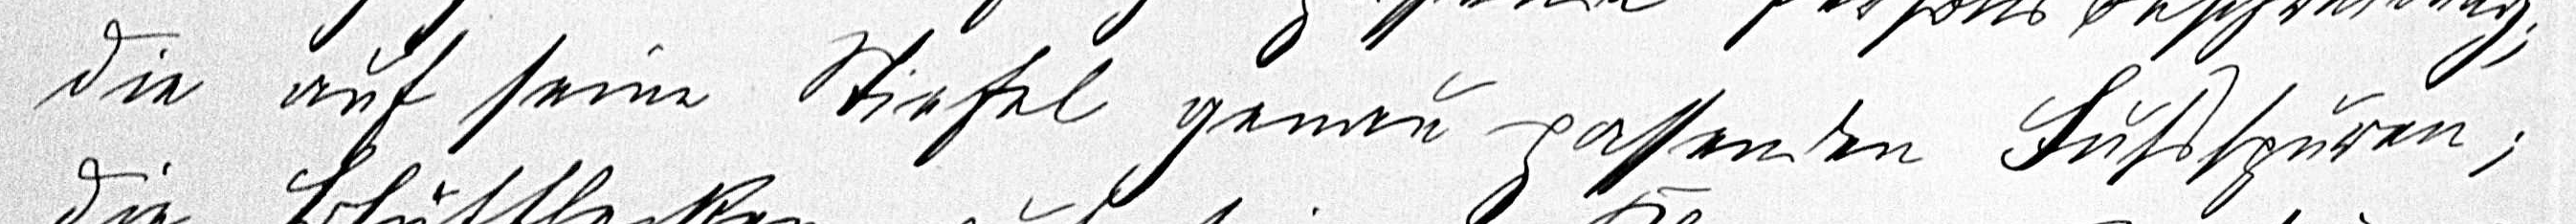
die auf seine Stiefel genau passenden Fußpuren;
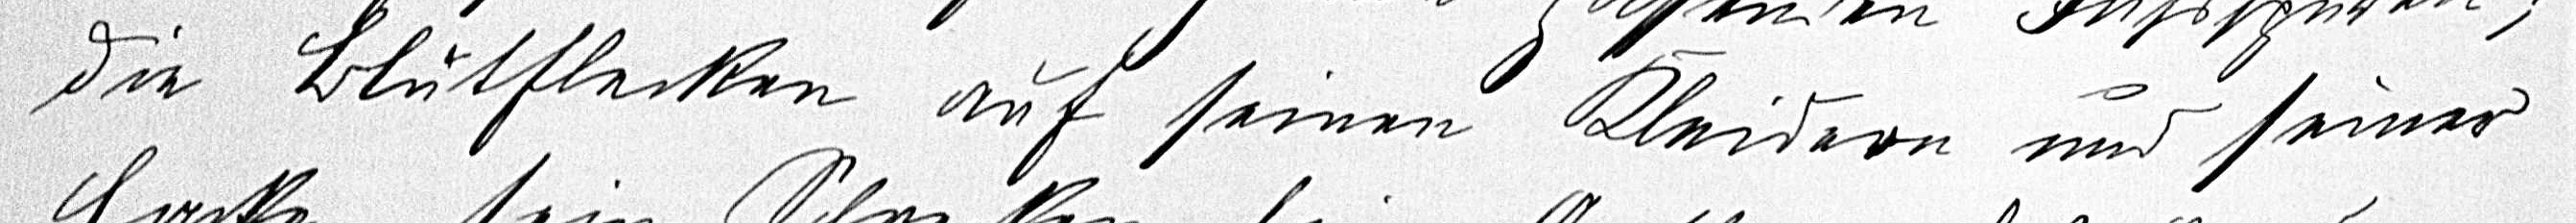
die Blutflecke auf seinen Kleidern und seiner
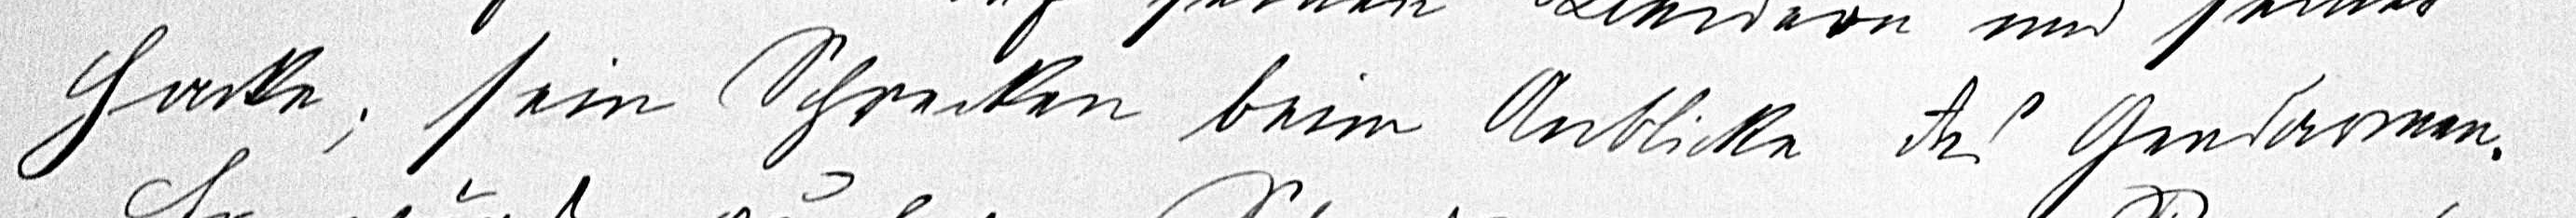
Harke; sein Schrecken beim Anblicke des Gendarmen.
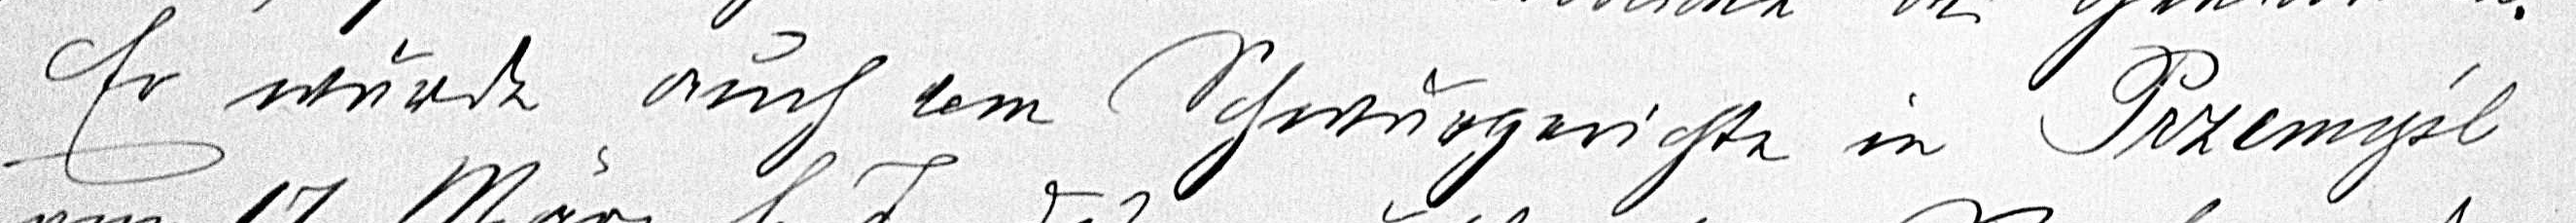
Er wurde auch xx Schwurgerichte in Pezemy'sl
